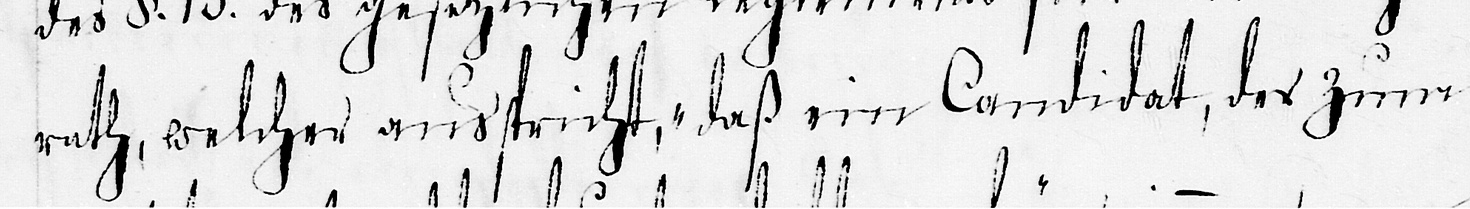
rath, welcher ausspricht, „daß ein Candidat, der zum
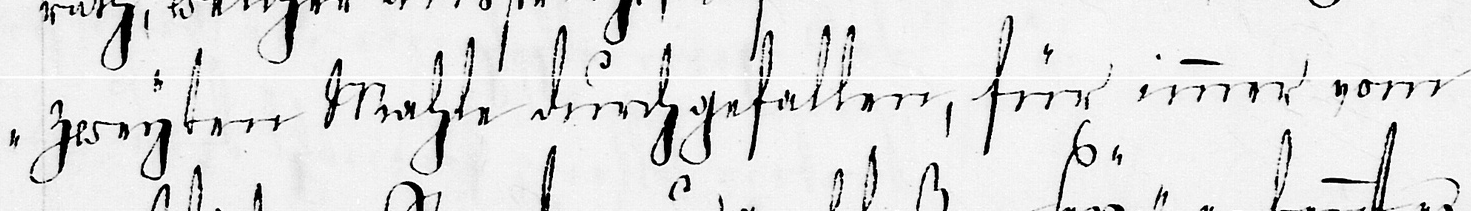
zweyten Mahle durchgefallen, für immer vom
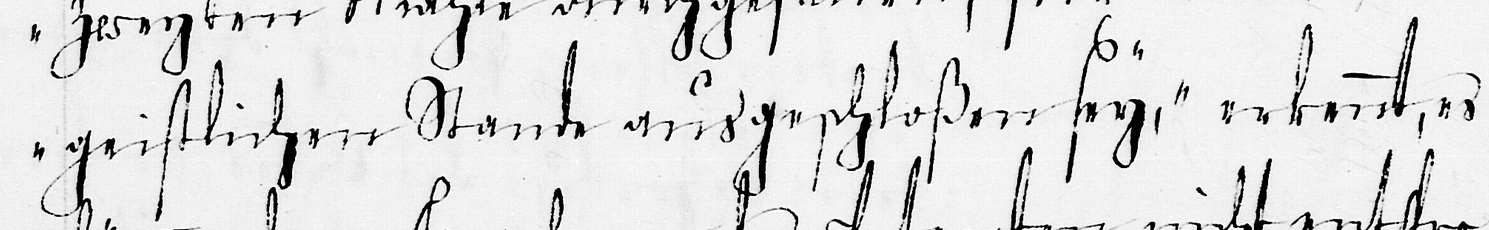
geistlichen Stande ausgeschloßen sey,“ erkennt, es
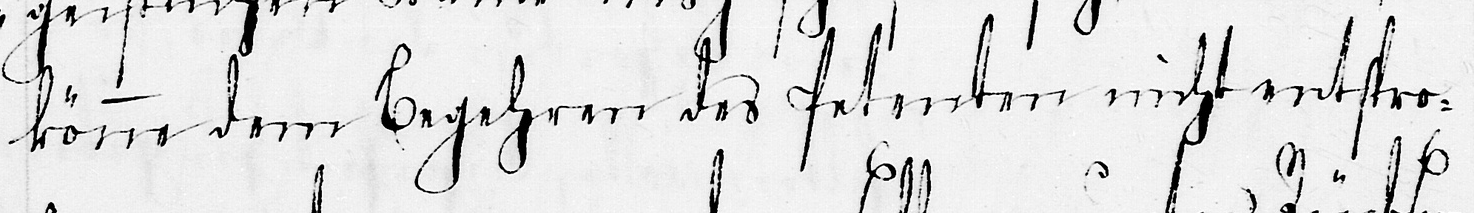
könne dem Begehren des Petenten nicht entspro¬
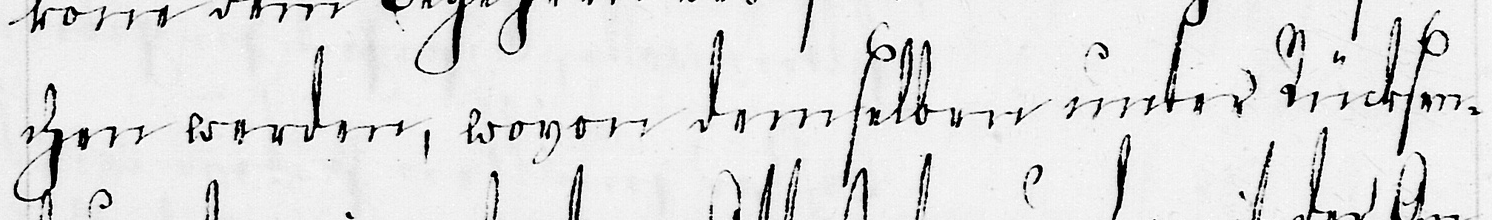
chen werden, wovon demselben unter Rücksen¬
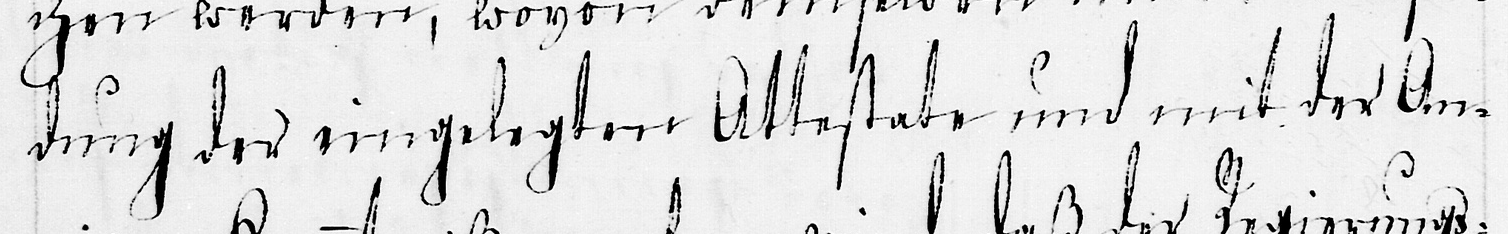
dung der eingelegten Attestate und mit der An¬
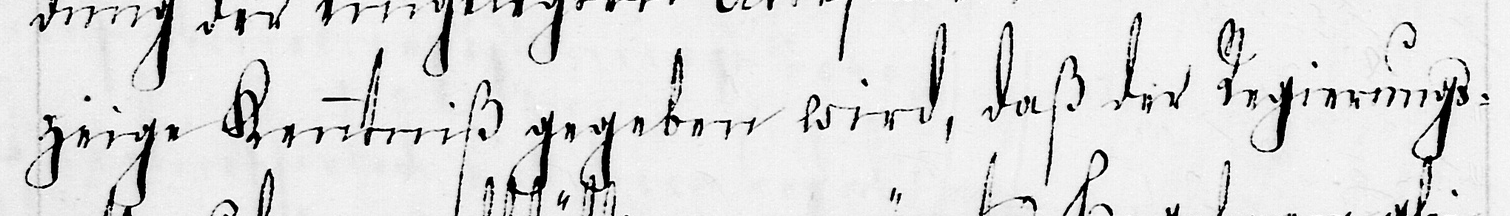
zeige Kenntniß gegeben wird, daß der Regierungs¬
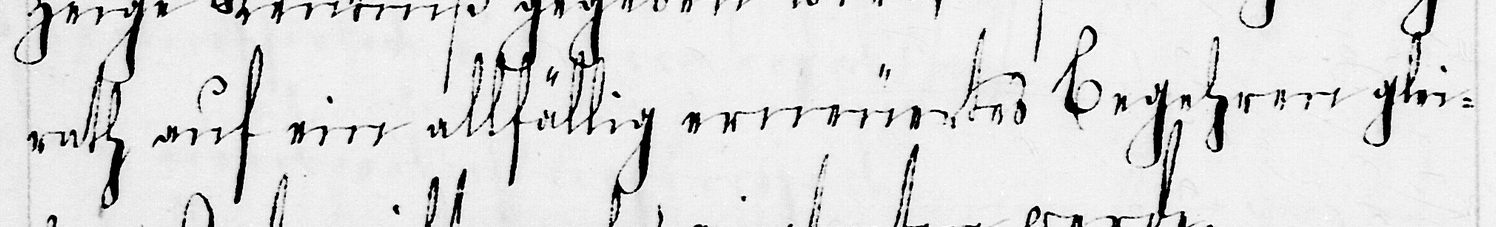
rath auf ein allfällig erneuertes Begehren glei¬
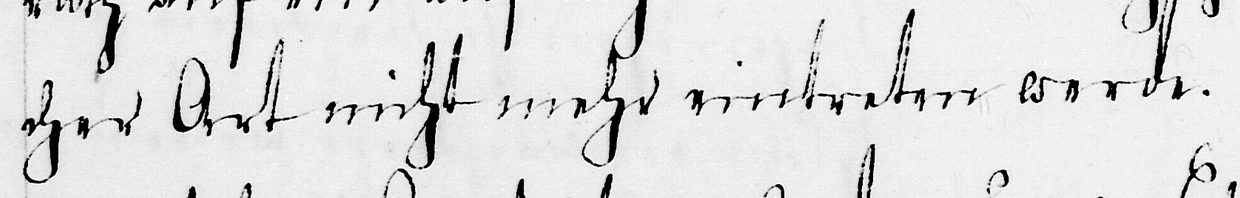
cher Art nicht mehr eintreten werde.
